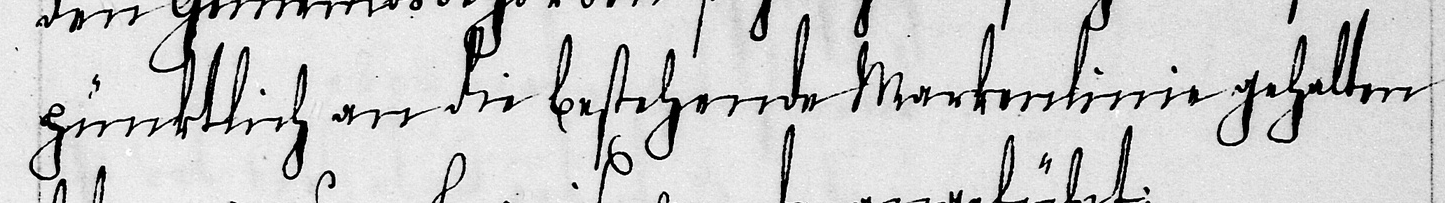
pünktlich an die bestehende Markenlinie gehalten
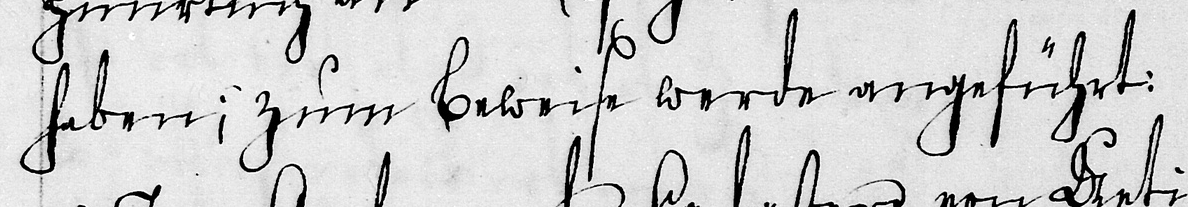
haben; zum Beweise werde angeführt:
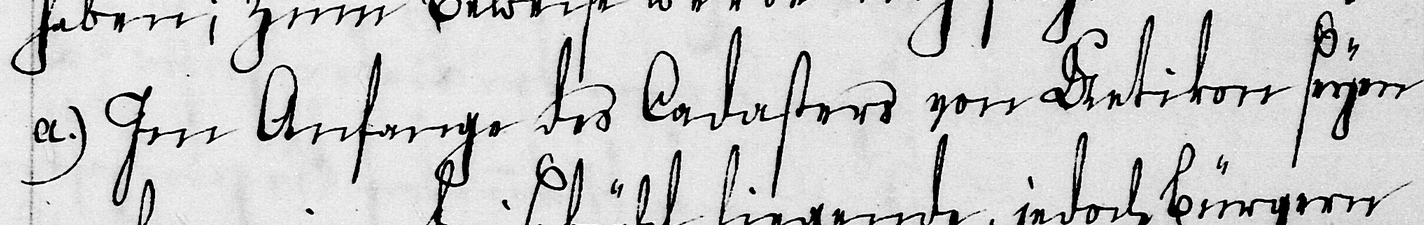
a.) Im Anfange des Cadasters von Uetikon seyen
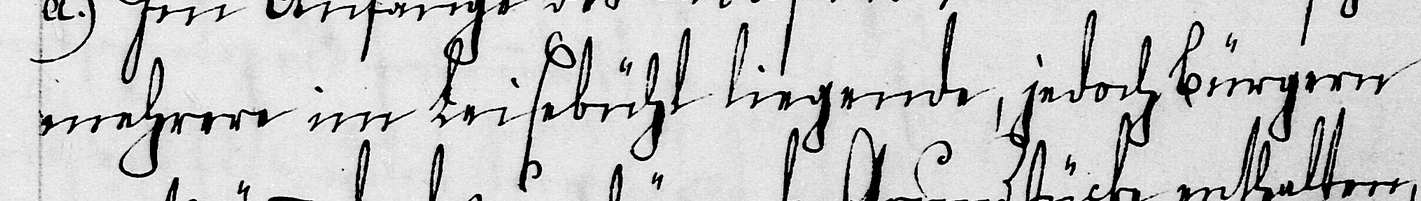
mehrere im Leisebühl liegende, jedoch Bürgern
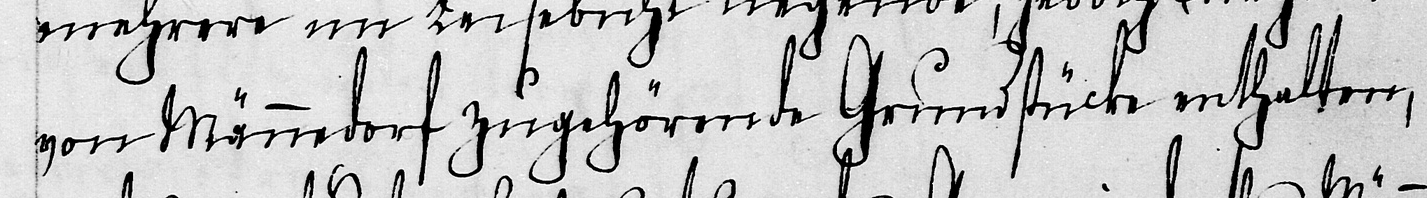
von Männedorf zugehörende Grundstücke enthalten,
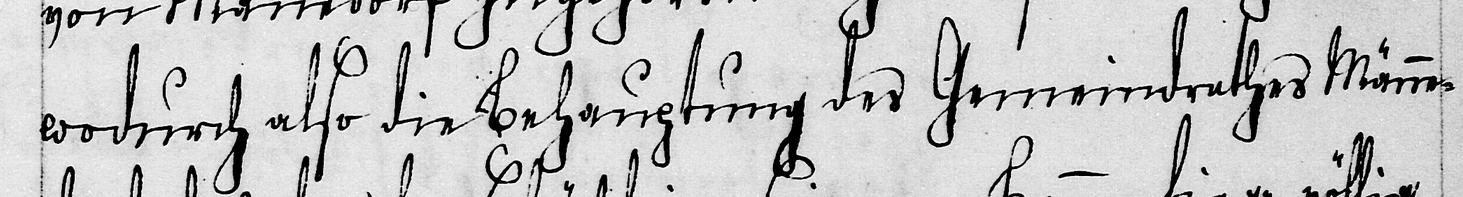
wodurch also die Behauptung des Gemeindrathes Männ¬
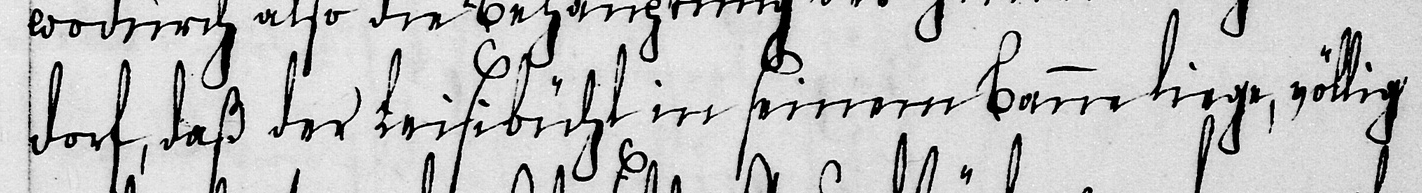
edorf, daß der Leisibühl in seinem Banne liege, völlig
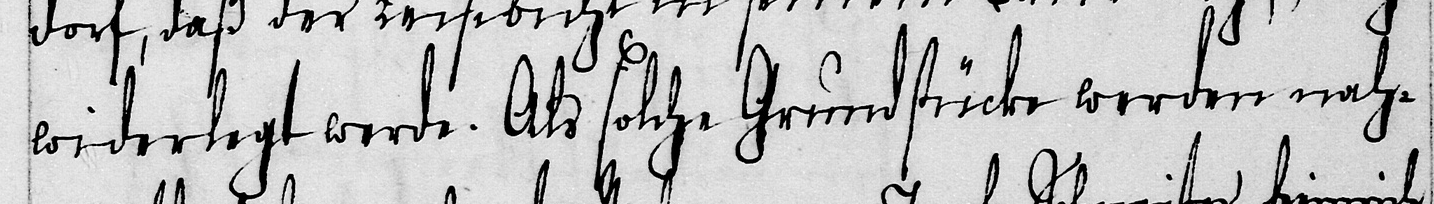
widerlegt werde. Als solche Grundstücke werden nah¬
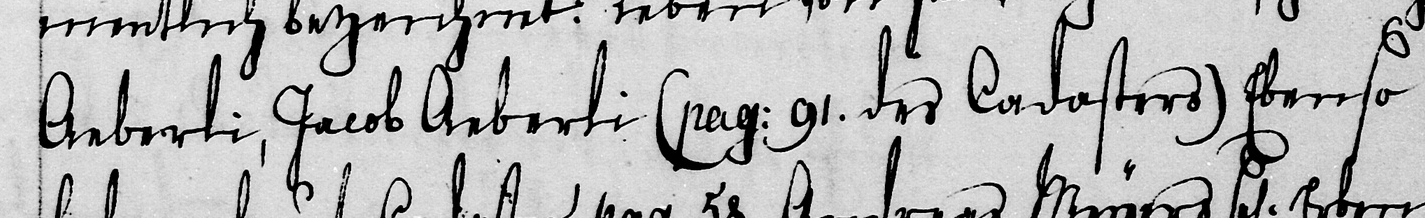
Aeberli, Jacob Aeberli (pag: 91. des Cadasters). Ebenso
